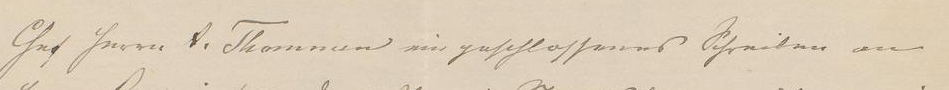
Chef Herrn A.Thommen ein geschlossenes Schreiben an
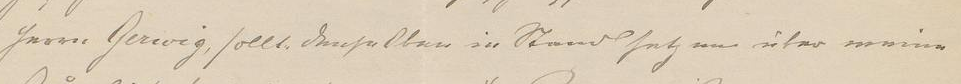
Herrn Gerwig, sollte denselben in Stand setzen über meine
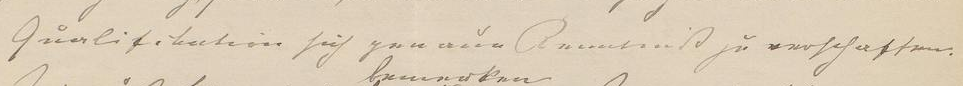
Qualifikation sich genaue Kenntniß zu verschaffen.
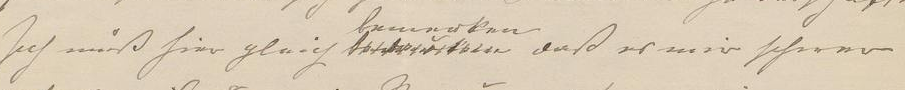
Ich muß hier gleich ...bemerken daß es mir schwer
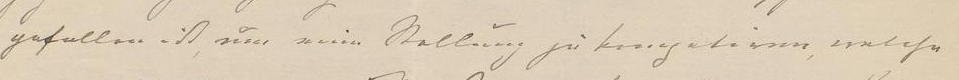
gefallen ist, um eine Stellung zu kompetiren, welche
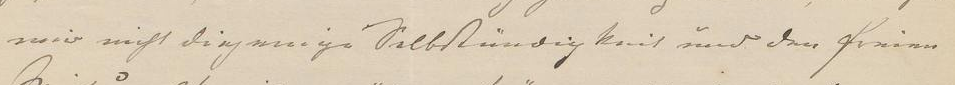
mir nicht diejenige Selbständigkeit und den freien
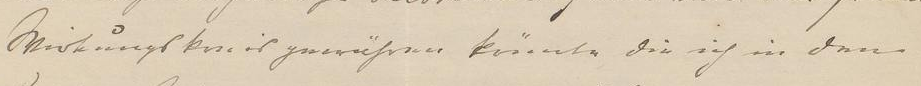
Wirkungskreis gewähren könnte die ich in den
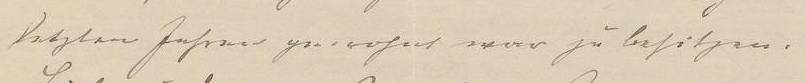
letzten Jahren gewohnt war zu besitzen. –
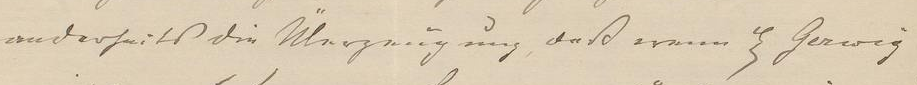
anderseits die Überzeugung, daß wenn H Gerwig
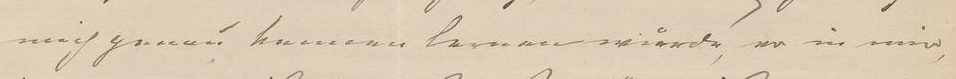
mich genau kennen lernen würde, er in mir,
